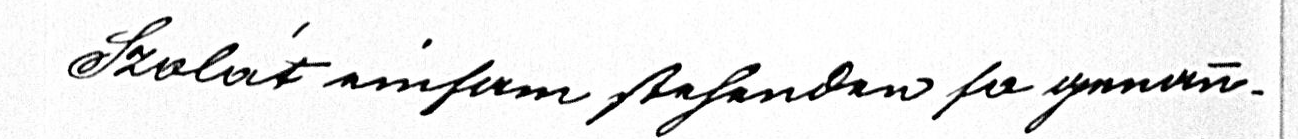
Szolát einsam stehenden so genann¬
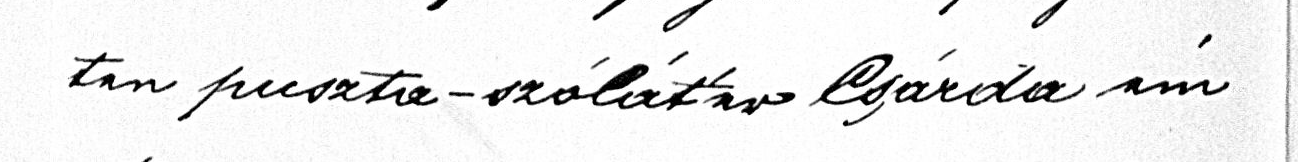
ten pusztre - szólát'er Csárda ein
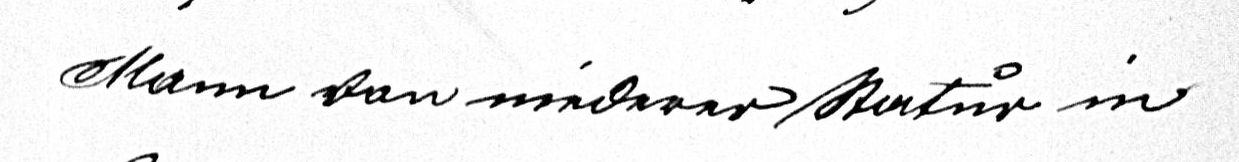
Mann von niederer Statur in
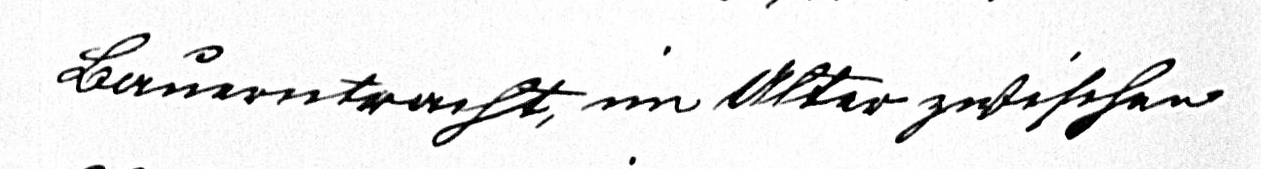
Bauerntracht, im Alter zwischen
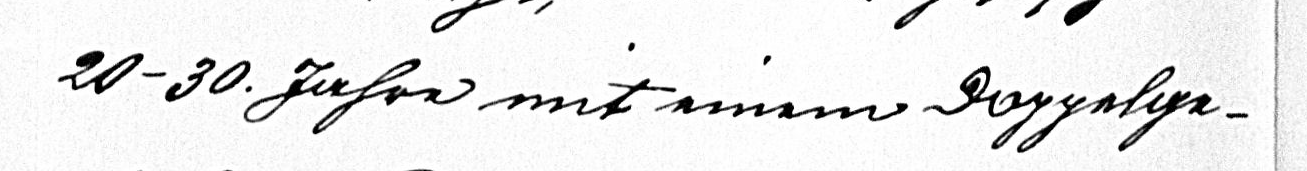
20 - 30. Jahre mit einem Doppelge¬
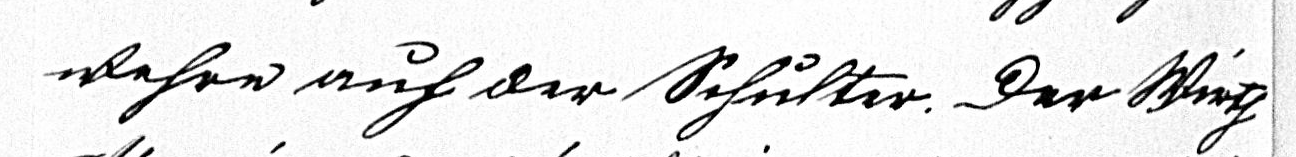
wehre auf der Schulter. Der Wirth
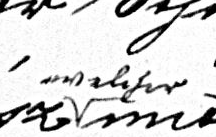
welcher
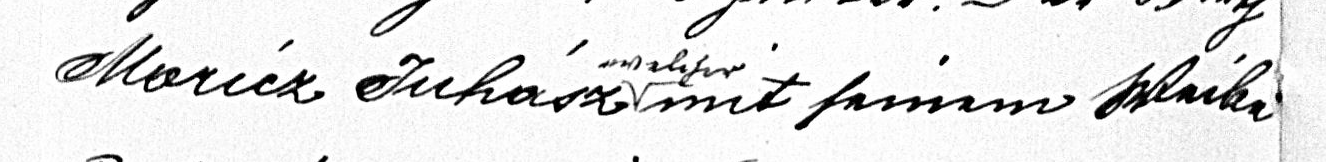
Moricz Jukász mit seinem Weike
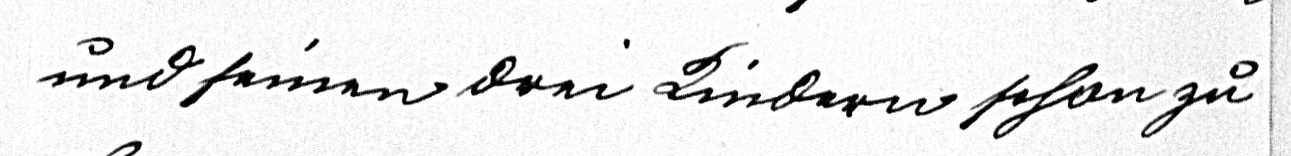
und seinen drei Kindern schon zu
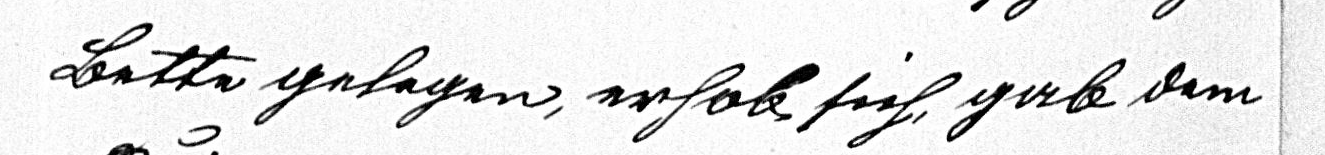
Bette gelegen, erhob sich, gab dem
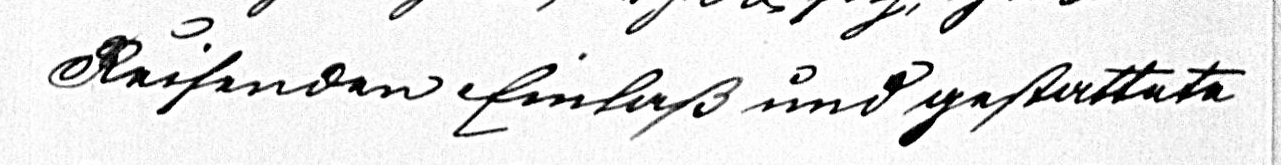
Reisenden Einlaß und gestattete
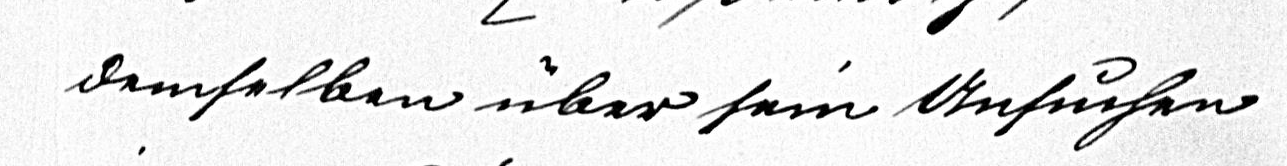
demselben über sein Ansuchen
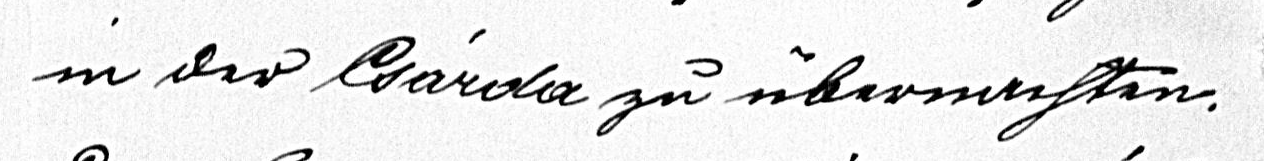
in der Csárda zu übernachten.
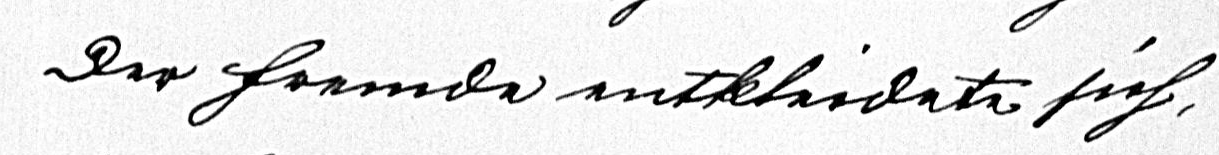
Der fremde entkleidete sich,
